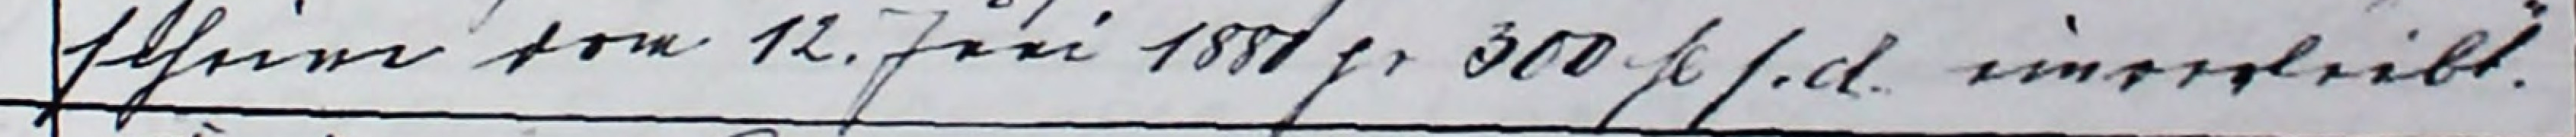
scheines vom 12. Juni 1881 pr 300 hl s. d. einverleibt.
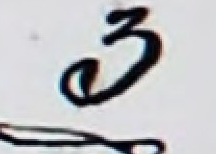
3
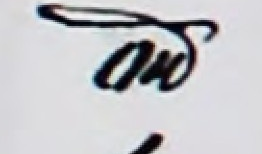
ad
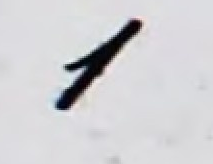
1
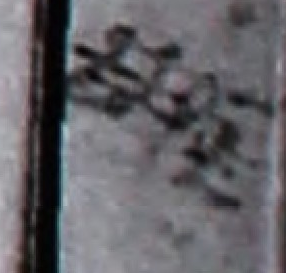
2305.
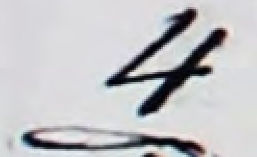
4
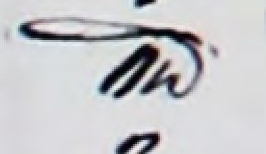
ad
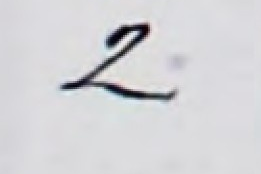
2
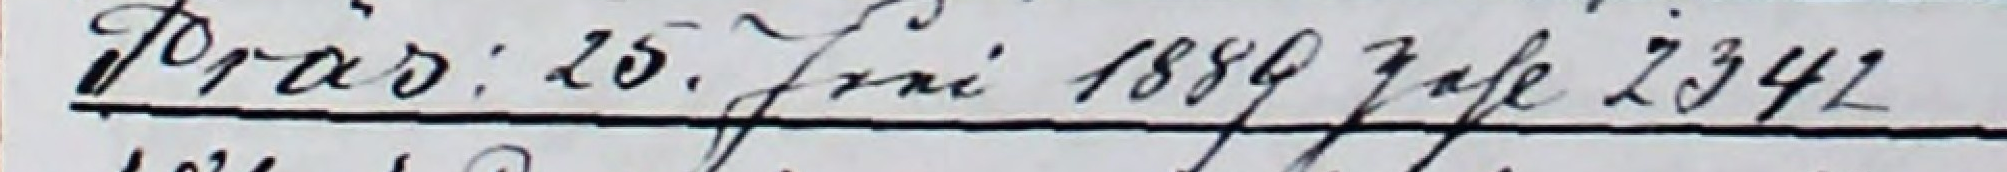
Präs: 25. Juni 1889 Zahl 2342
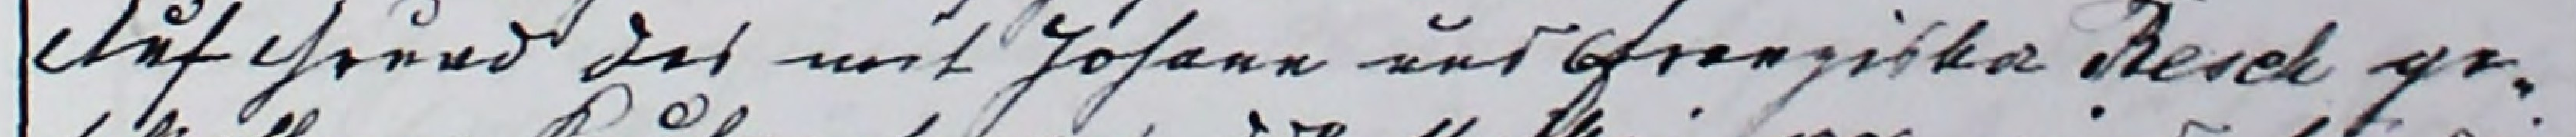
Auf Grund des mit Johann aus Franziska Resch ge„
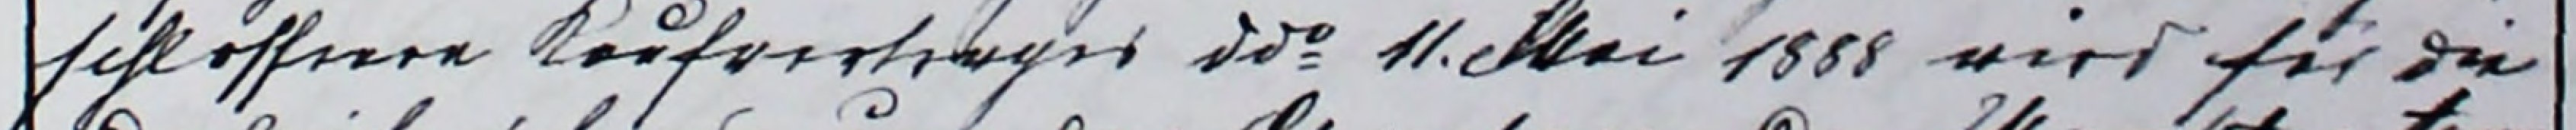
schlossene Kaufvertrages ddo 11. Mai 1888 wird für die
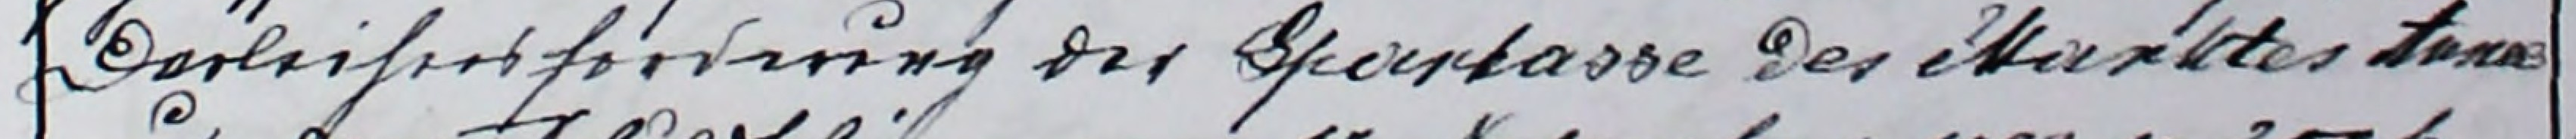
Darleihensforderung der Sparkasse des Marktes Aussee
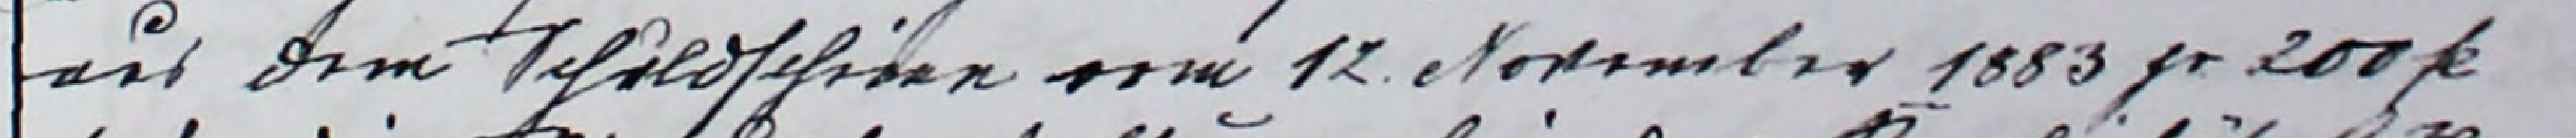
aus dem Schuldscheine vom 12. November 1883 pr. 200 fl
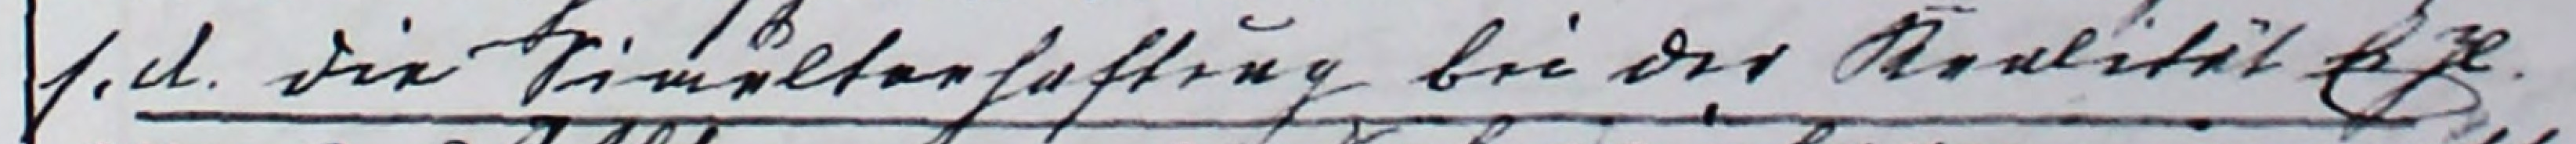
s.d. die Simultanhaftung bei der Realität E Zl.
